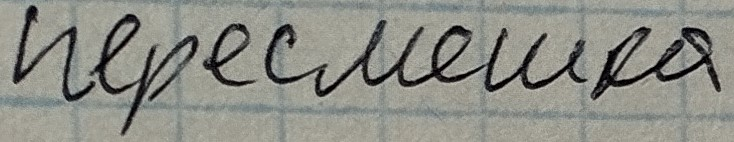пересмешка
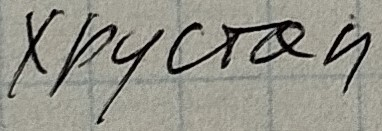хрустан
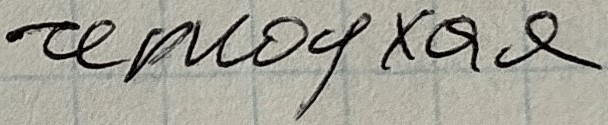черноухая
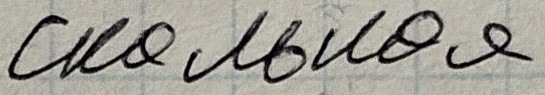скальноя
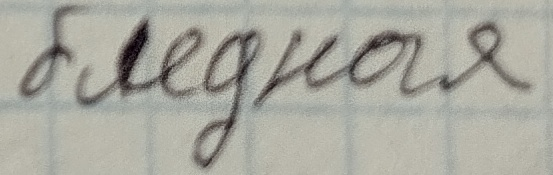бледная
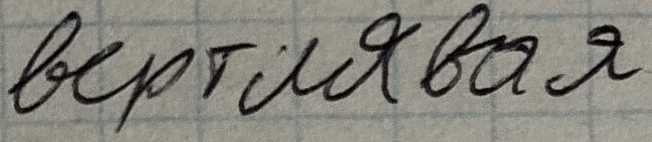вертлявая
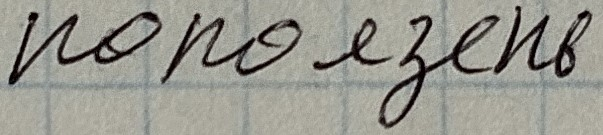поползень
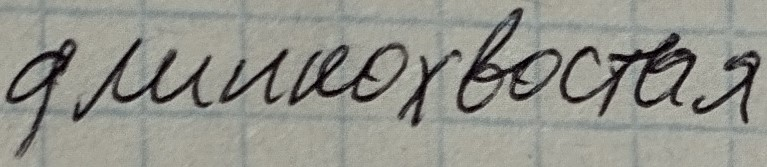длиннохвостая
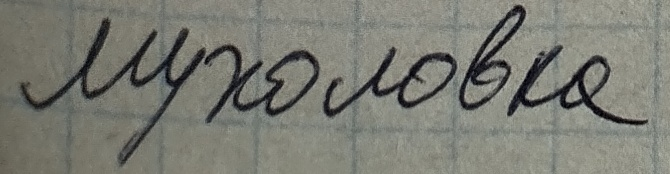мухоловка
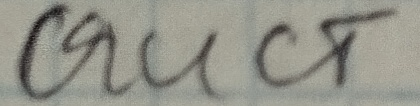аист
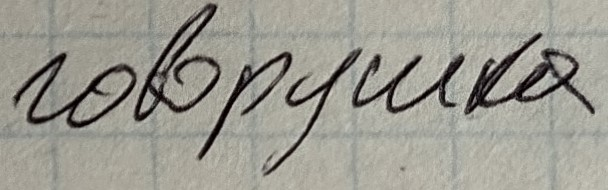говорушка
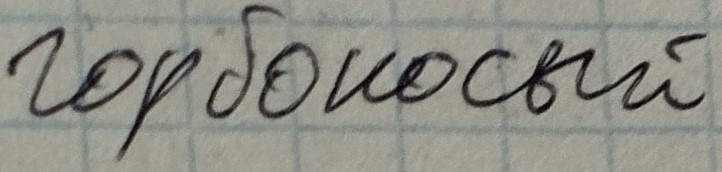горбоносый
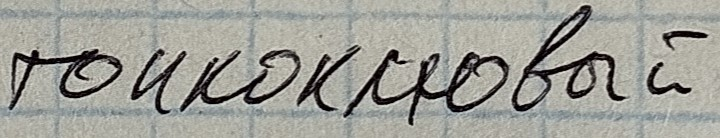тонкоклювый
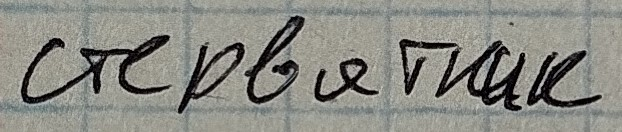стервятник
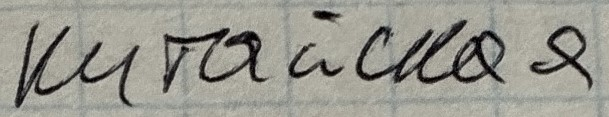китайская
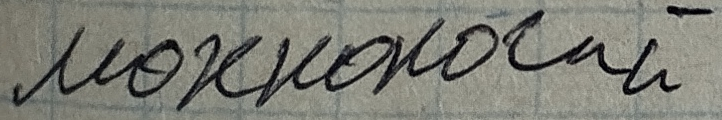мохноногий
